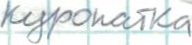куропатка
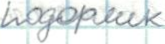подорлик
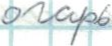огарь
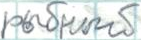рыбный
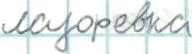лазоревка
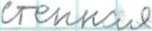степная
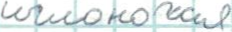иглоногая
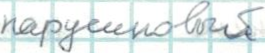парусиновый
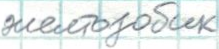желтозобик
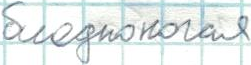бледноногая
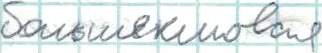большеклювая
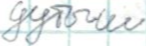дутыш
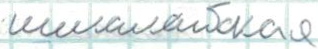гималайская
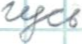гусь
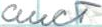аист
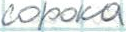сорока
